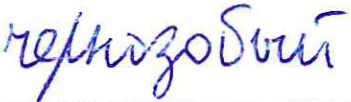чернозобый
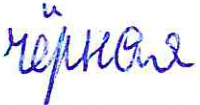чёрная
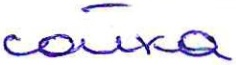сойка
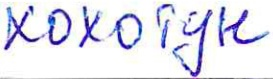хохотун
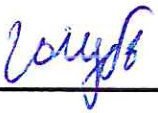голубь
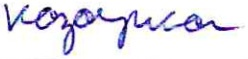козарка
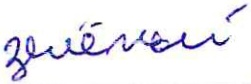зелёный
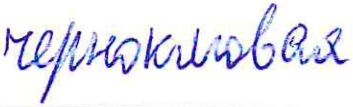черноклювая
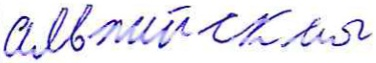альпийская
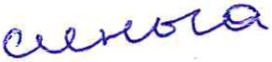синьга
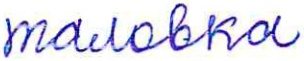таловка
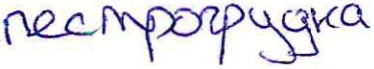пестрогрудка
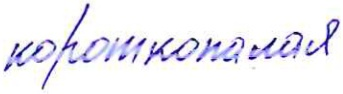короткопалая
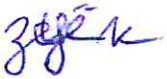зуёк
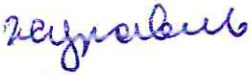журавль
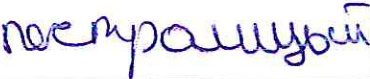пестролицый
